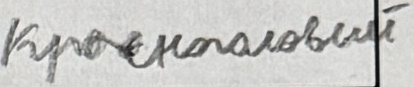красноголовый
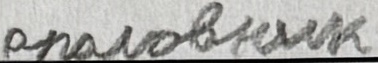ополовник
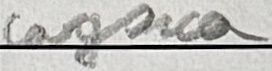саджа
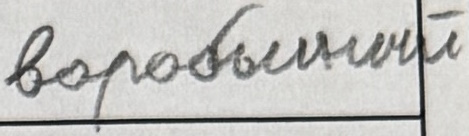воробьиный
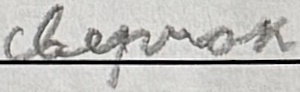сверчок
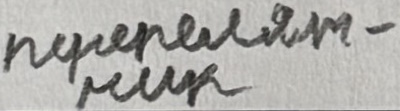перепелят-ник
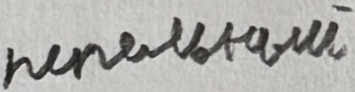пепельный
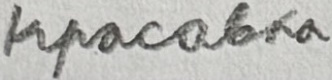красавка
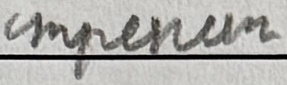стрепет
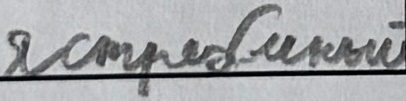ястребиный
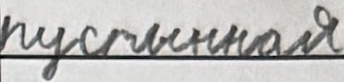пустынная
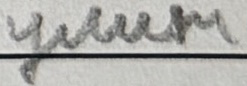улит
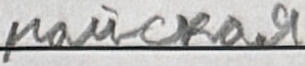райская
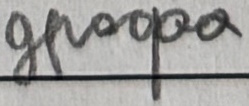дрофа
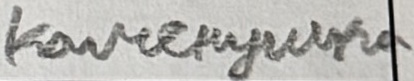каменушка
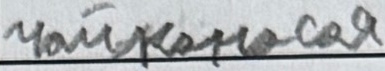чайконосая
